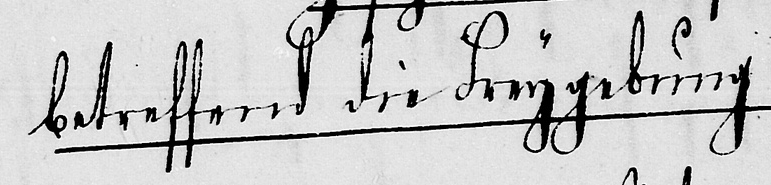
betreffend die Freygebung
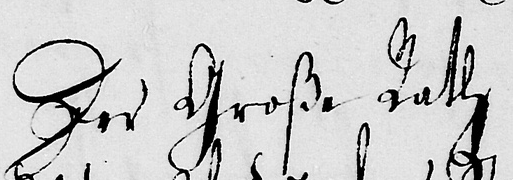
Der Große Rath
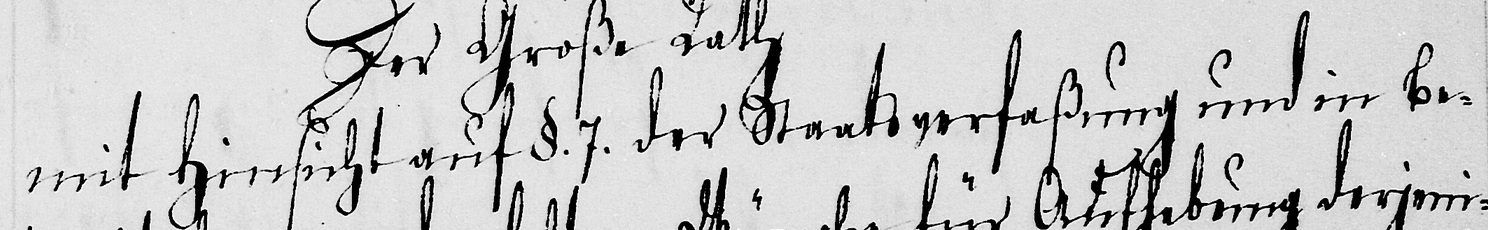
mit Hinsicht auf §. 7. der Staatsverfaßung und in Be¬
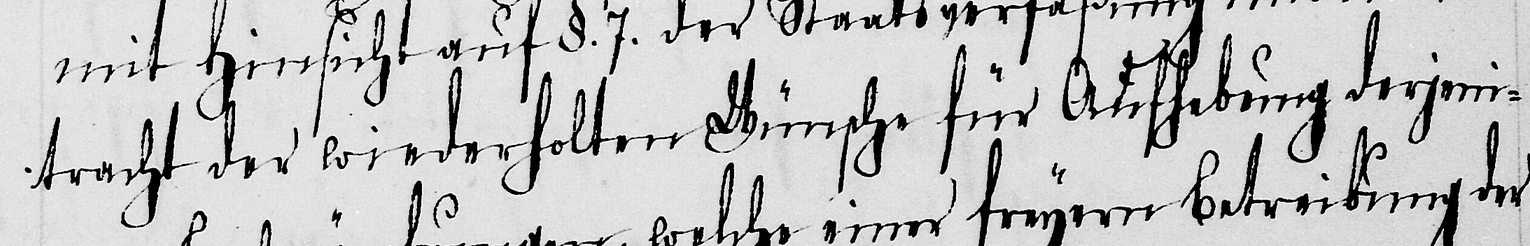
tracht der wiederholten Wünsche für Aufhebung derjeni¬
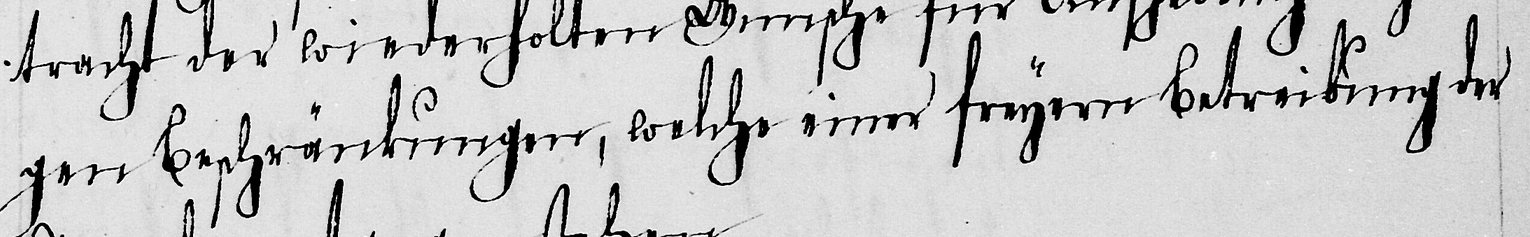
gen Beschränkungen, welche einer freyen Betreibung der
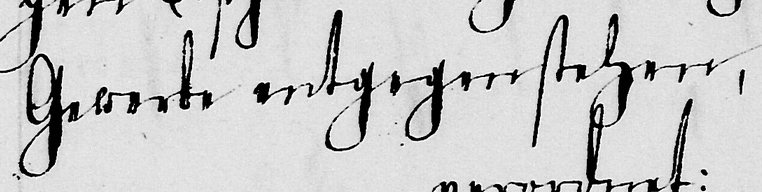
Gewerbe entgegenstehen,
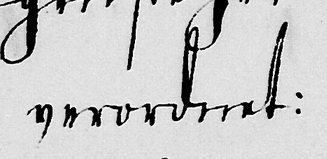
verordnet:
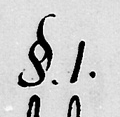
§. 1.
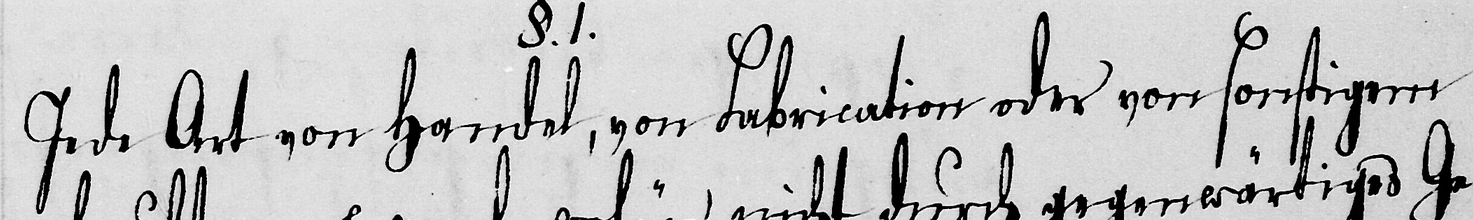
Jede Art von Handel, von Fabrication oder von sonstigem
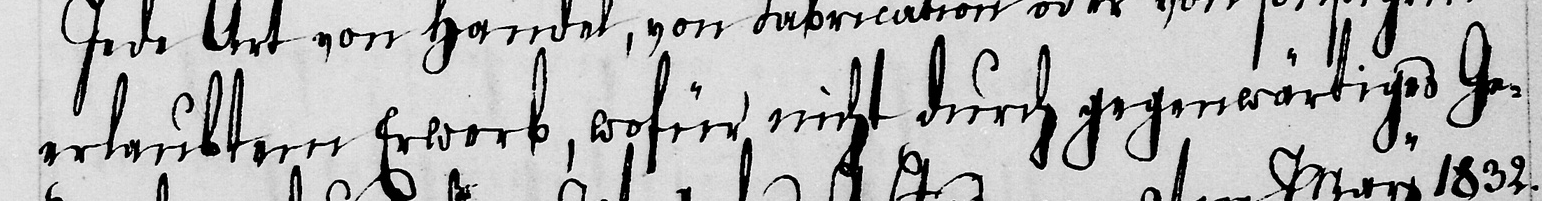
erlaubtem Erwerb, wofür nicht durch gegenwärtiges Ges¬
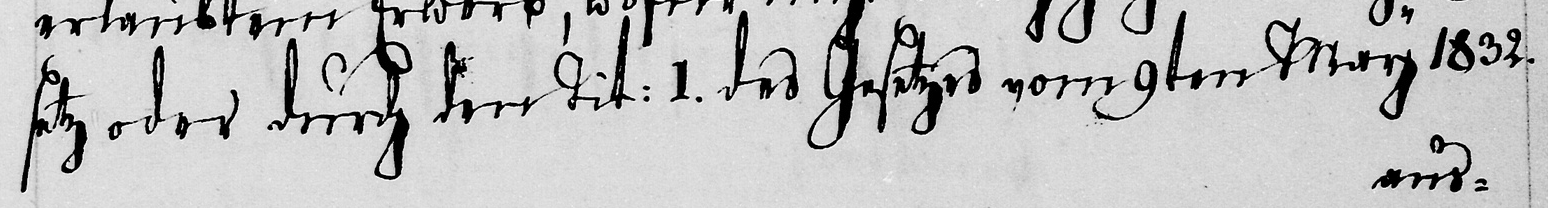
etz oder durch den Tit: I. des Gesetzes vom 9ten May 1832.
